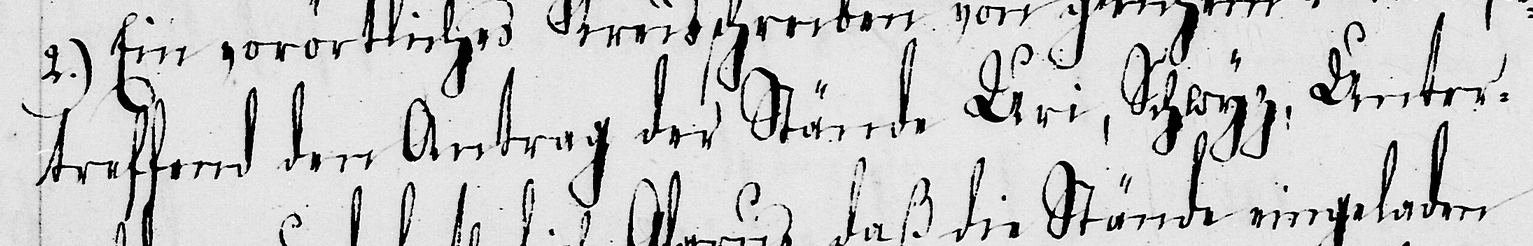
treffend den Antrag der Stände Uri, Schwyz, Unter¬
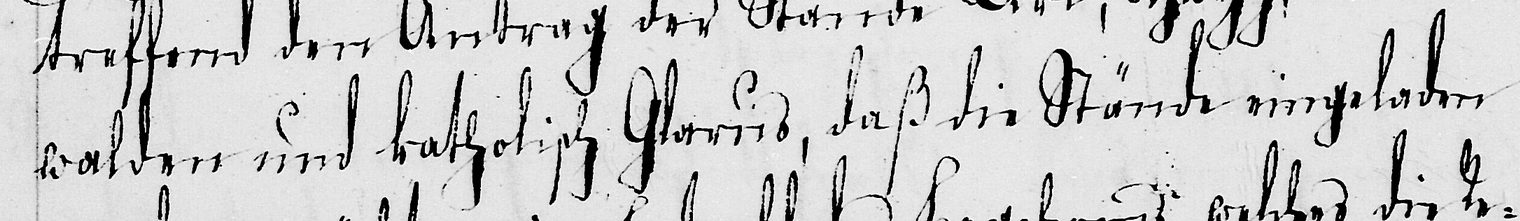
walden und katholisch Glarus, daß die Stände eingeladen
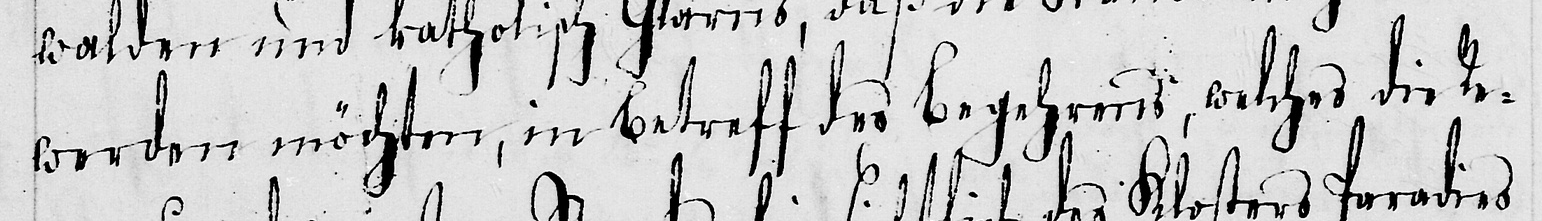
werden möchten, in Betreff des Begehrens, welches die Re¬
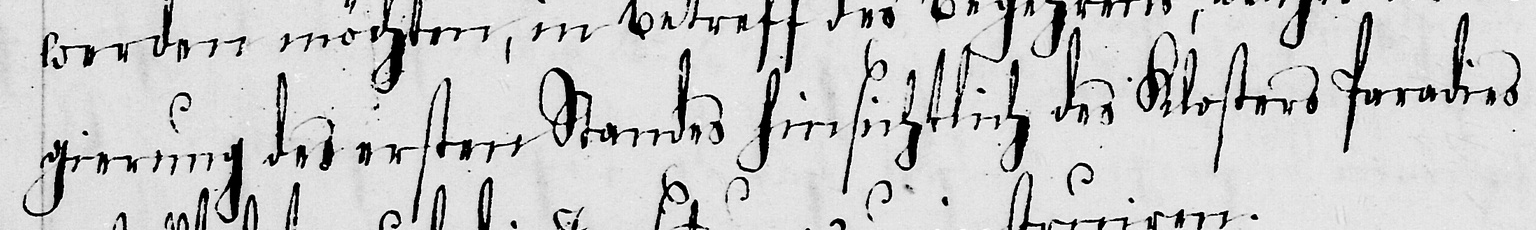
gierung des ersten Standes hinsichtlich des Klosters Paradies
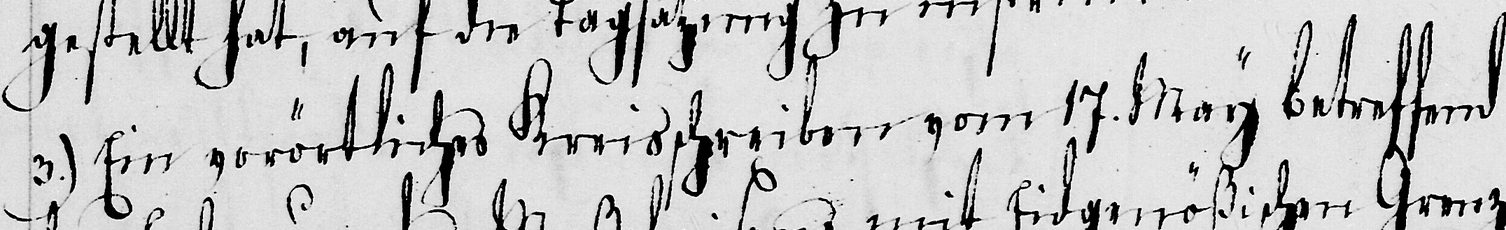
3.) Ein vorörtliches Kreisschreiben vom 17. May betreffend
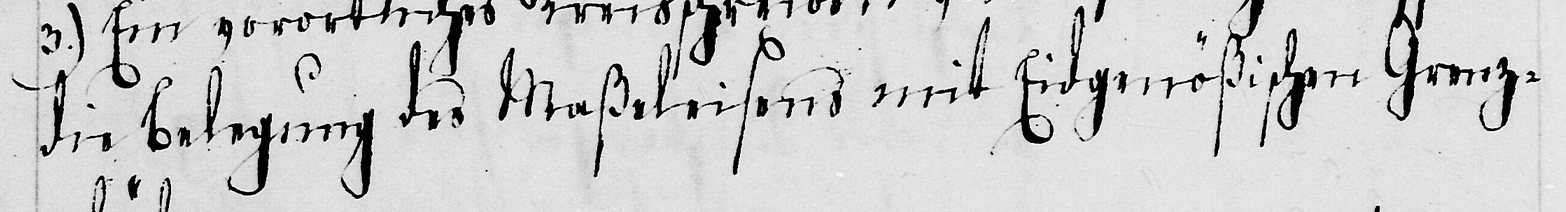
die Belegung des Maßeleisens mit Eidgenößischen Grenz¬
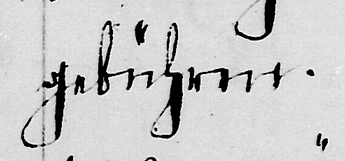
gebühren.
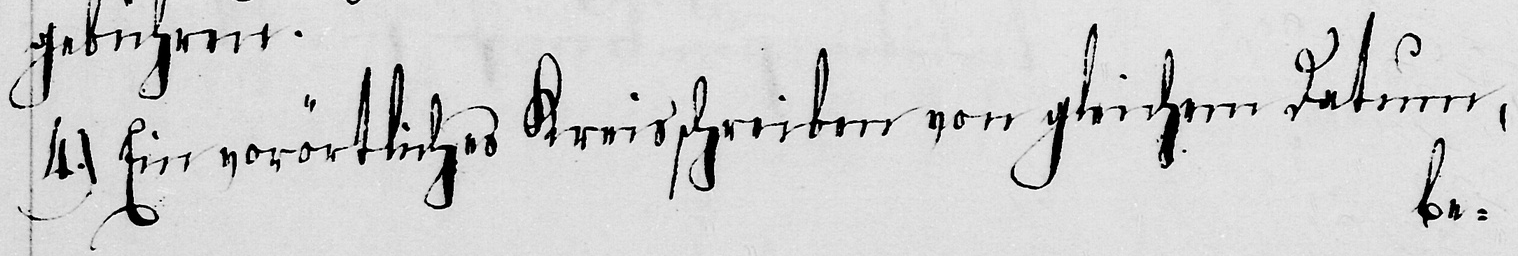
4.) Ein vorörtliches Kreisschreiben von gleichem Datum,
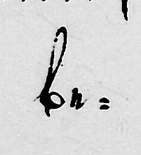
ge¬
